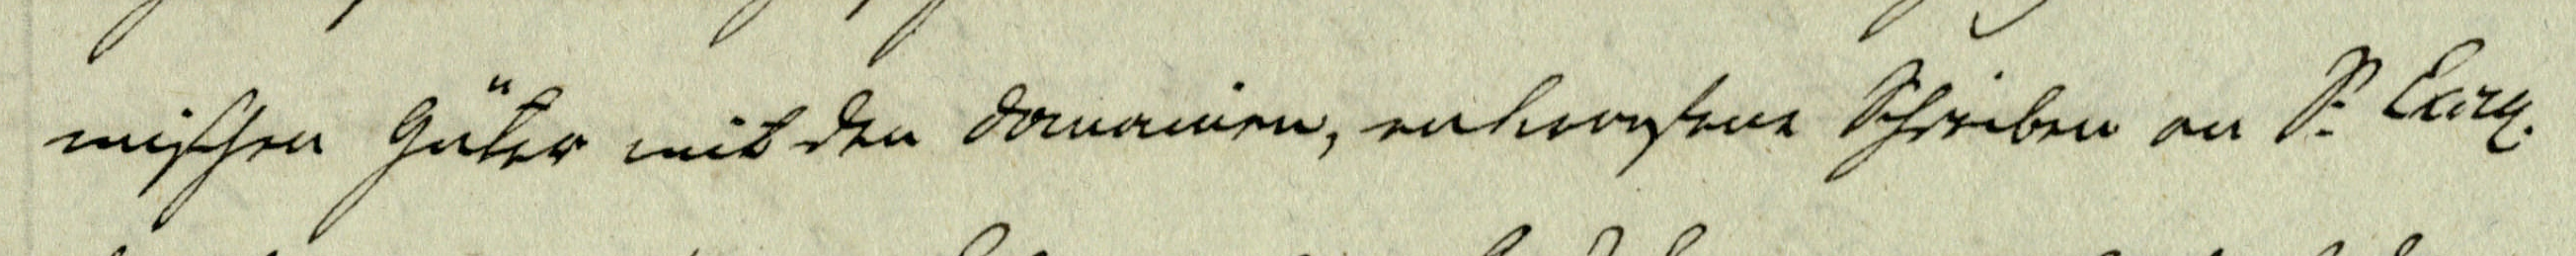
mischen Güter mit den Domainen, entworfene Schreiben an Sr Excel.
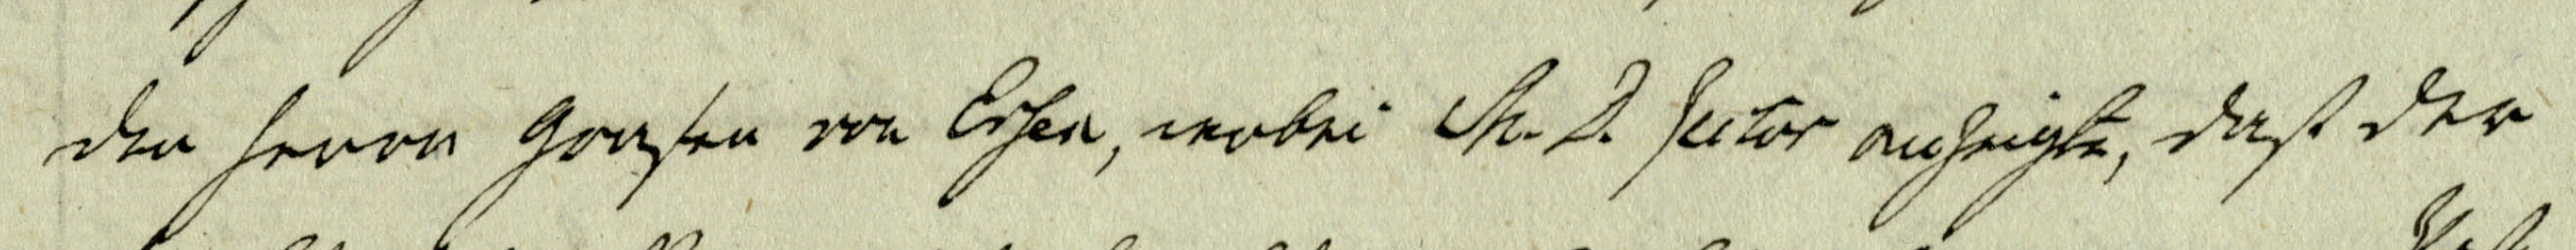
der Herrn Grafen von Essen, wobei M. D. Rector anzeigte, daß der
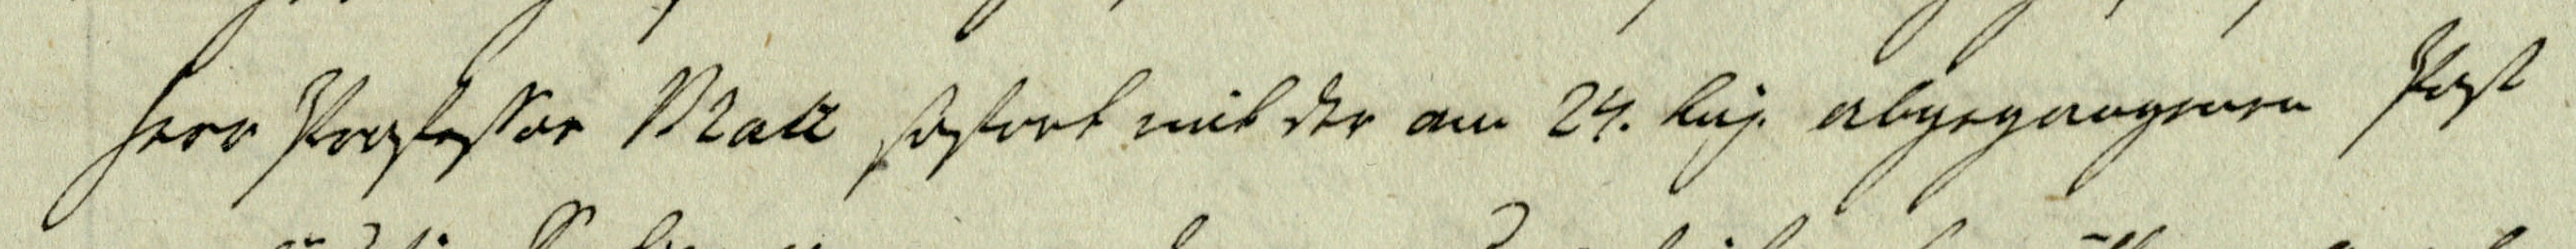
Herr Professor Bratt sofort mit der am 24. huj. abgegangenen Post
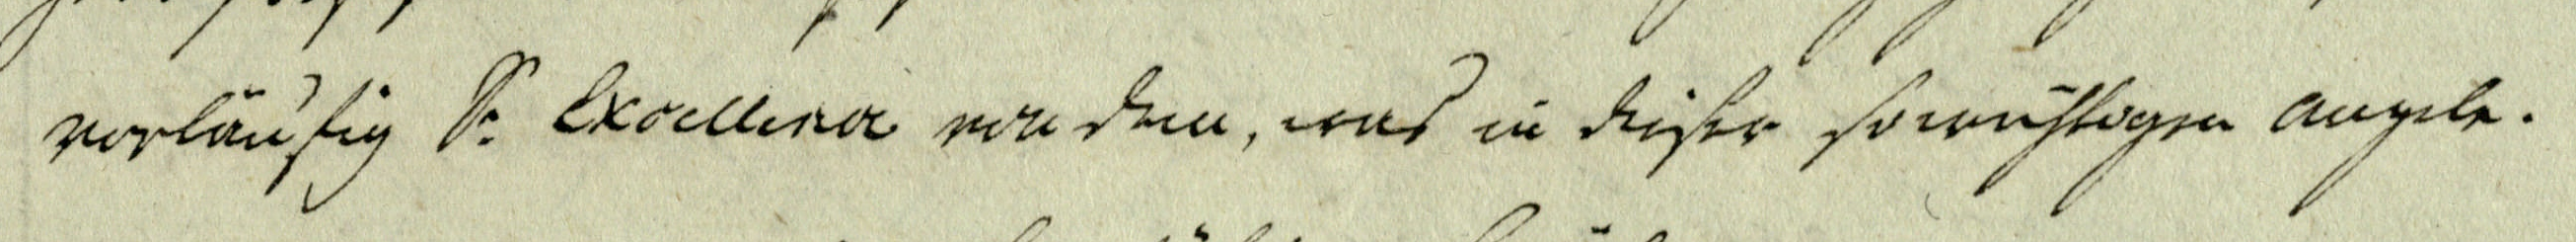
vorläufig Sr Excellence von dem, was in dieser so wichtigen Angele¬
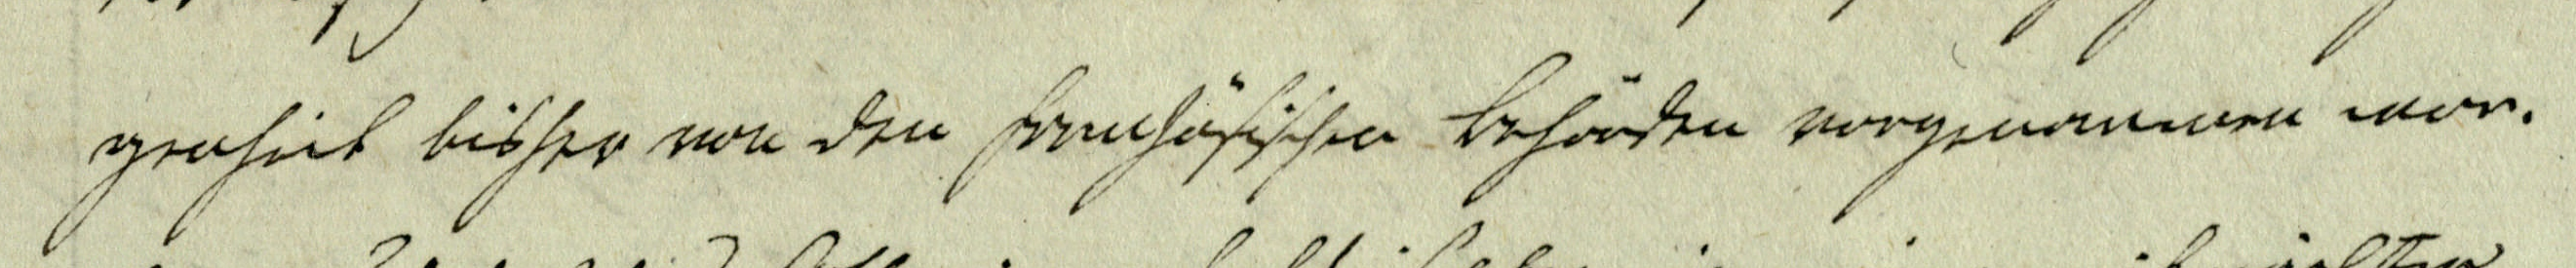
genheit bisher von den Französischen Behörden vorgenommen wor¬
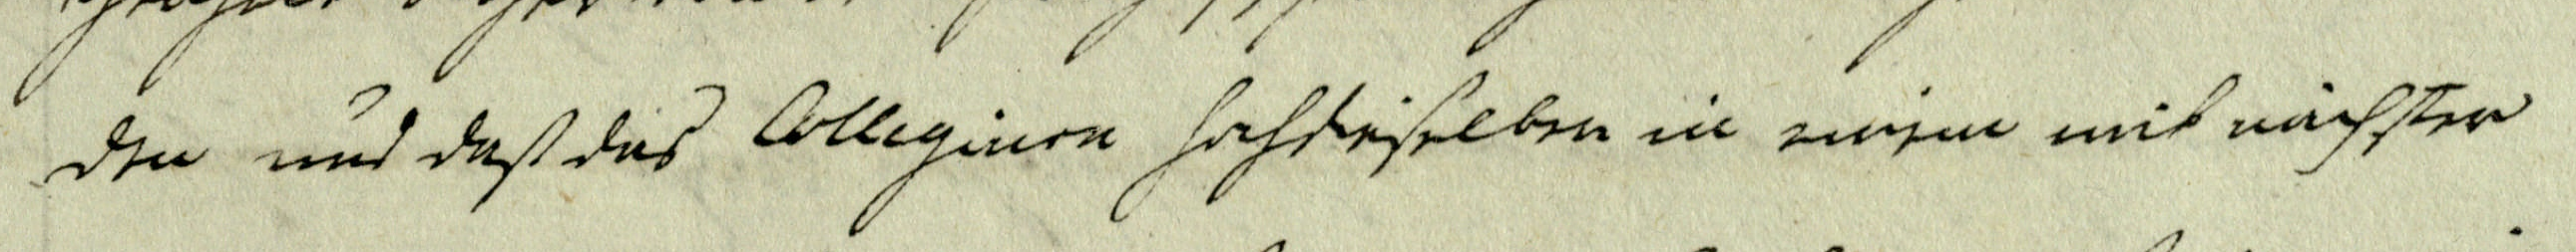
den und daß das Collegium hochdieselben in einem mit nächster
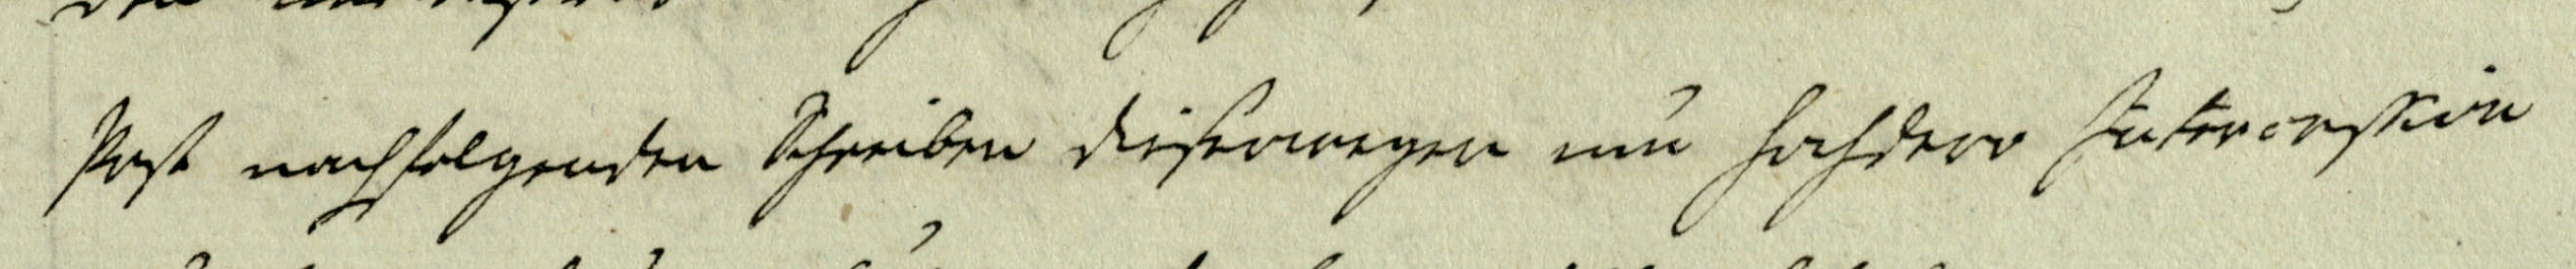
Post nachfolgenden Schreiben dieserwegen um hochdero Intercession
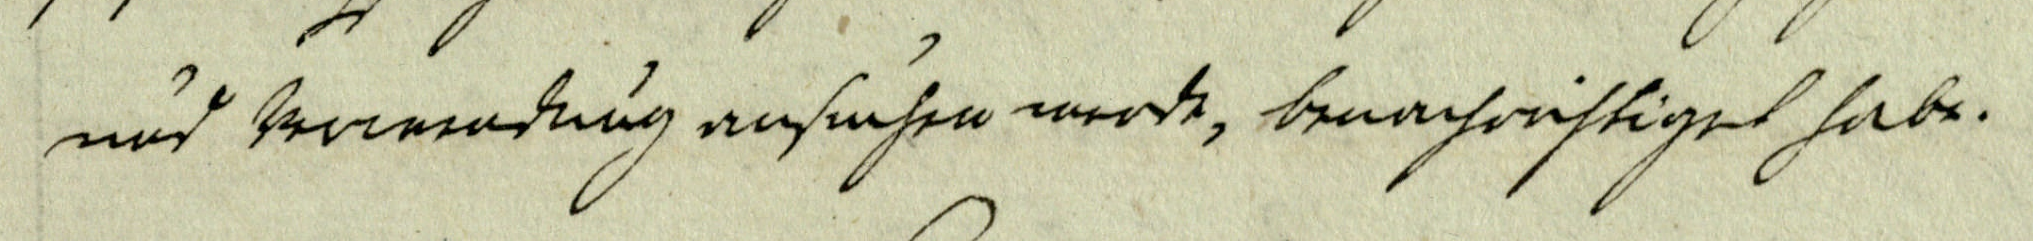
und Verwendung ansuchen werde, benachrichtiget habe.
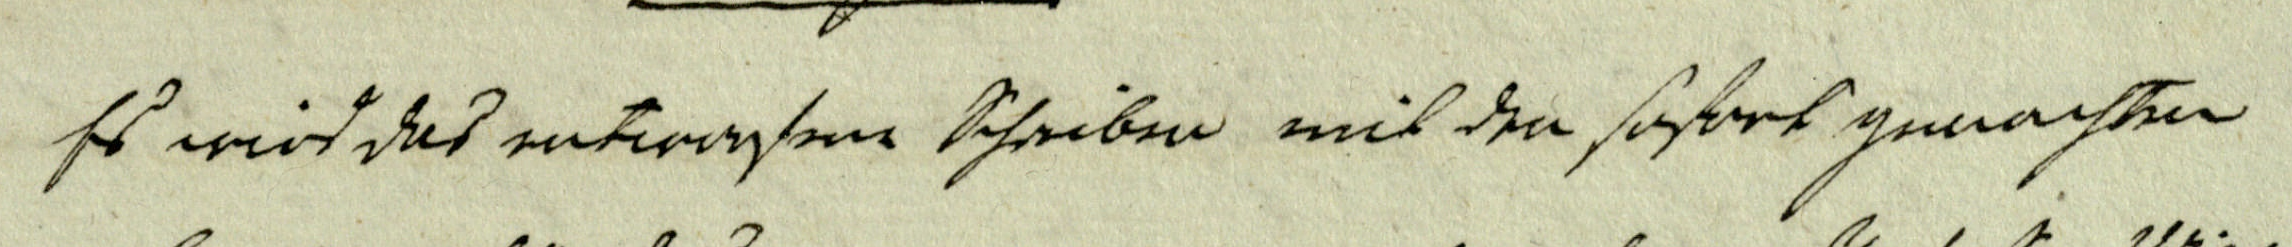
Es wird das entworfene Schreiben mit den sofort gemachten
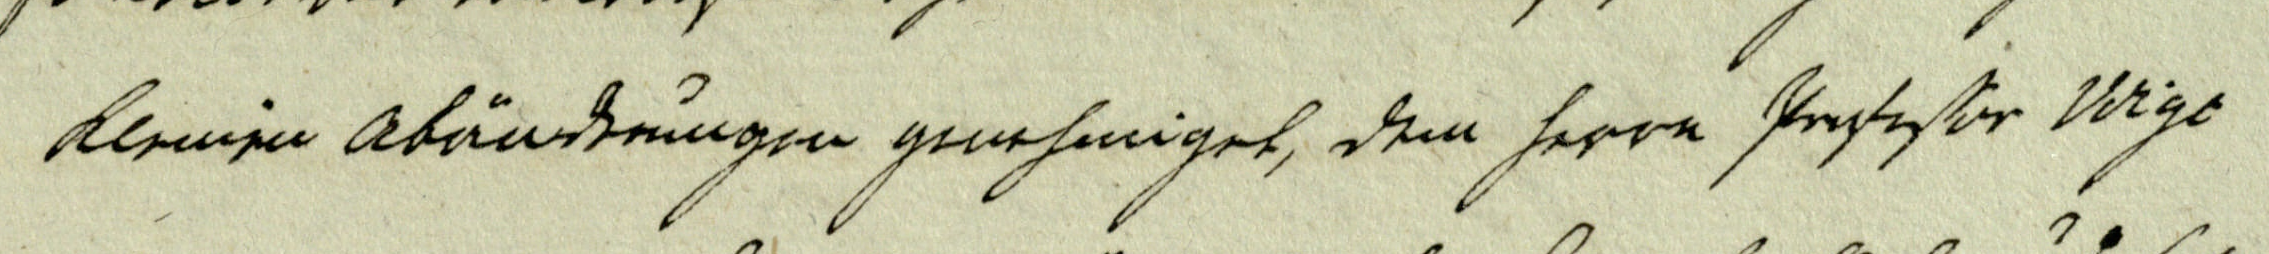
kleinen Abänderungen genehmiget, dem Herrn Professor Voigt
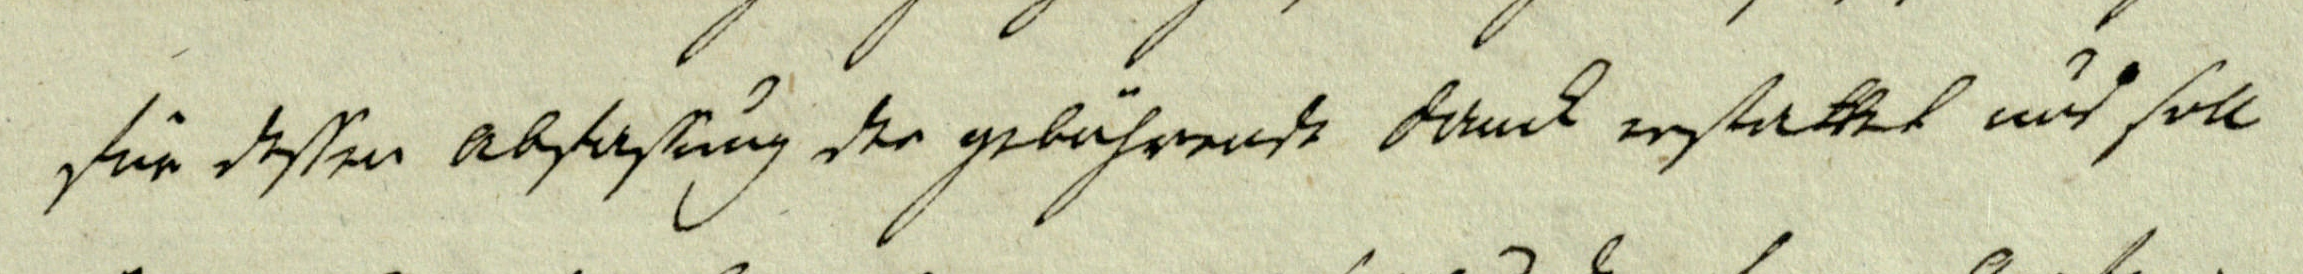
für dessen Abfassung der gebührende Dank erstattet und soll
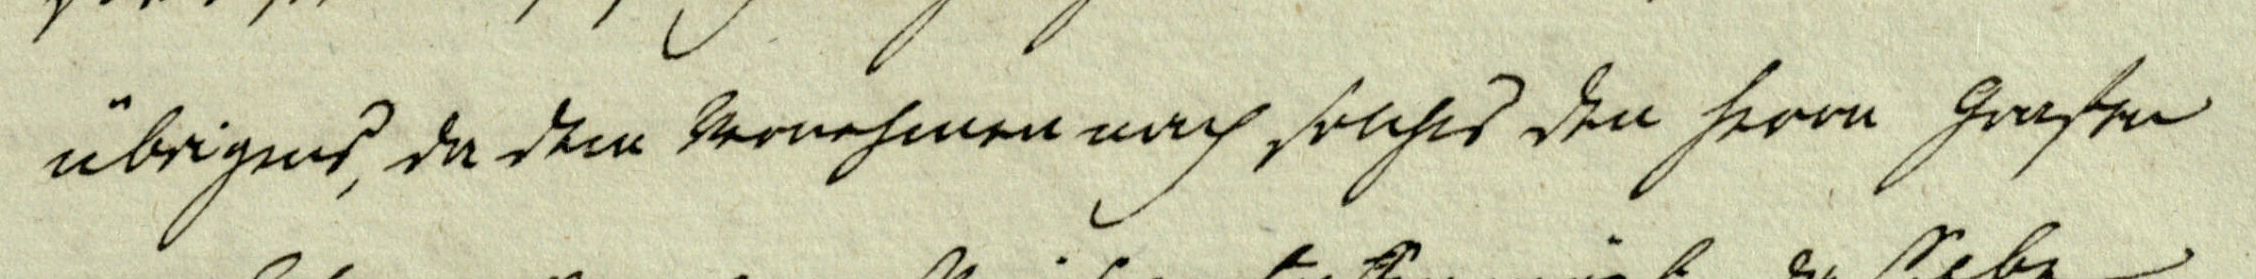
übrigens, da dem Vernehmen nach solches den Herrn Grafen
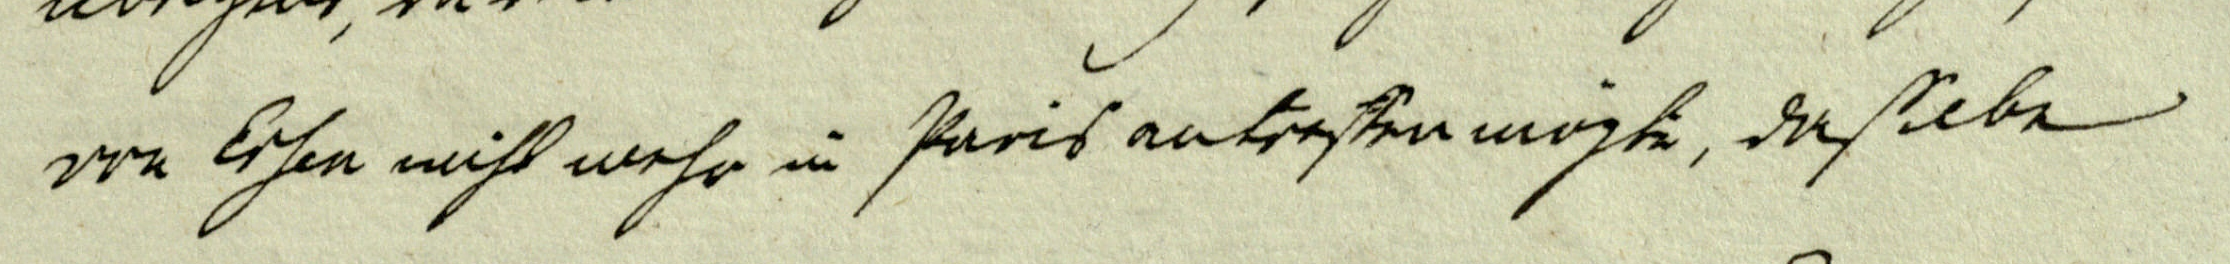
von Essen nicht mehr in Paris antreffen mögte, dasselbe
